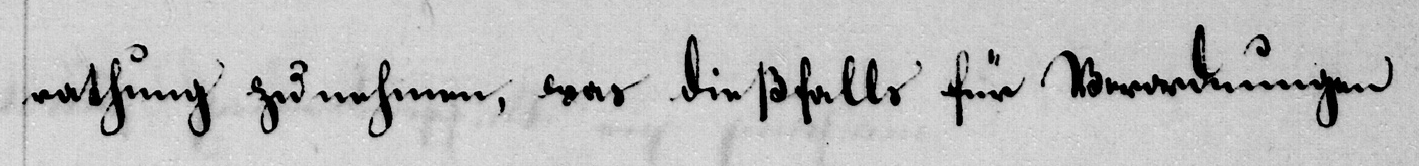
rathung zu nehmen, was dießfalls für Verordnungen
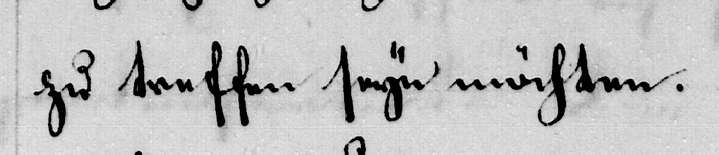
zu treffen seyn möchten.
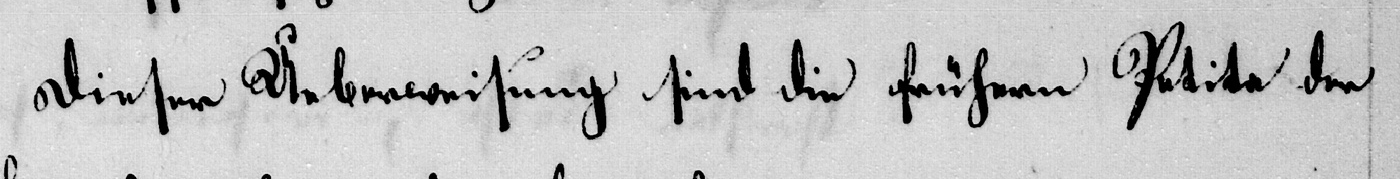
Dieser Ueberweisung sind die früheren Petite der
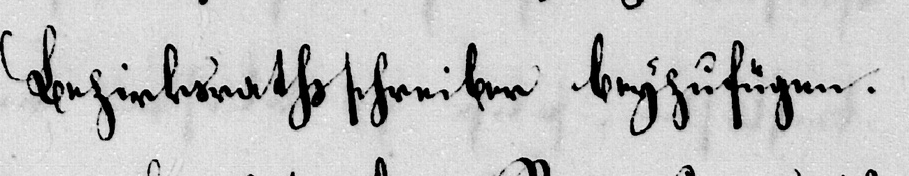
Bezirksrathsschreiber beyzufügen.
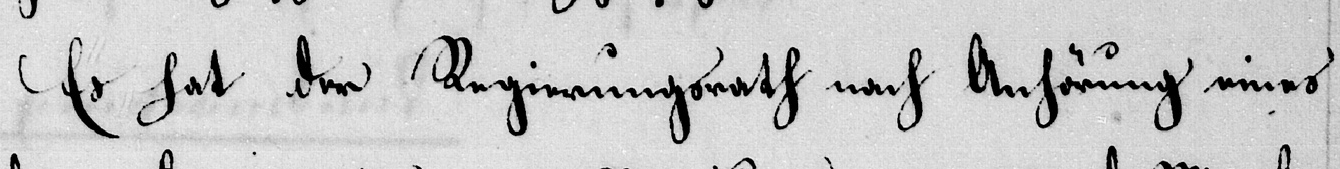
Es hat der Regierungsrath nach Anhörung eines
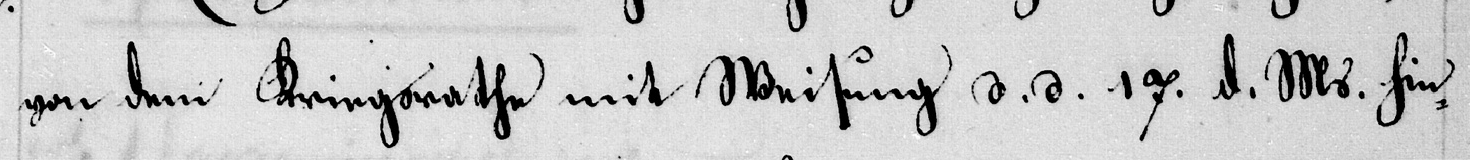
von dem Kriegsrathe mit Weisung d. d. 17. d. Ms. hin¬
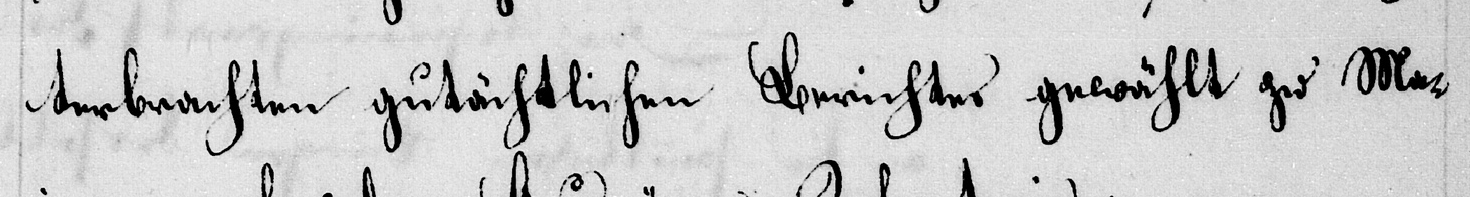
terbrachten gutächtlichen Berichtes gewählt zu Ma¬
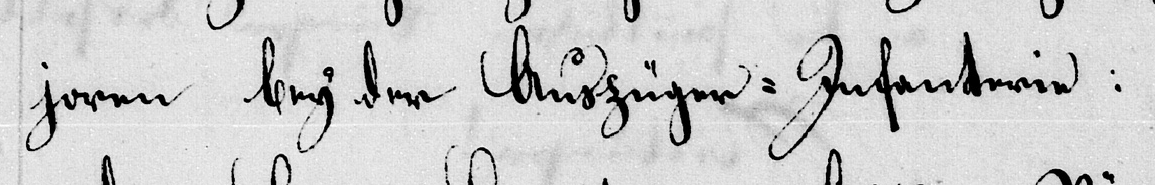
joren bey der Auszüger-Infanterie:
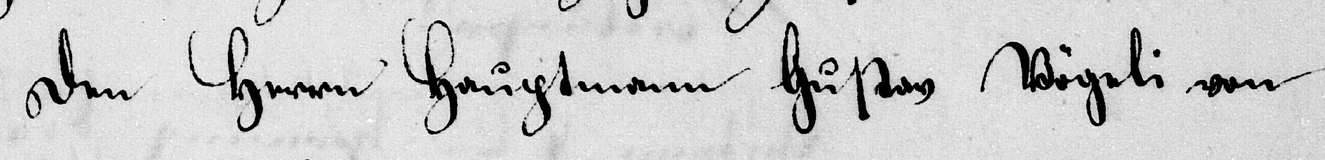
Den Herrn Hauptmann Gustav Vögeli von
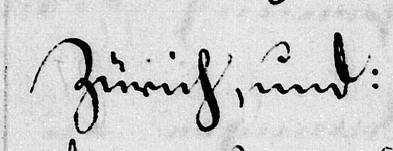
Zürich, und:
